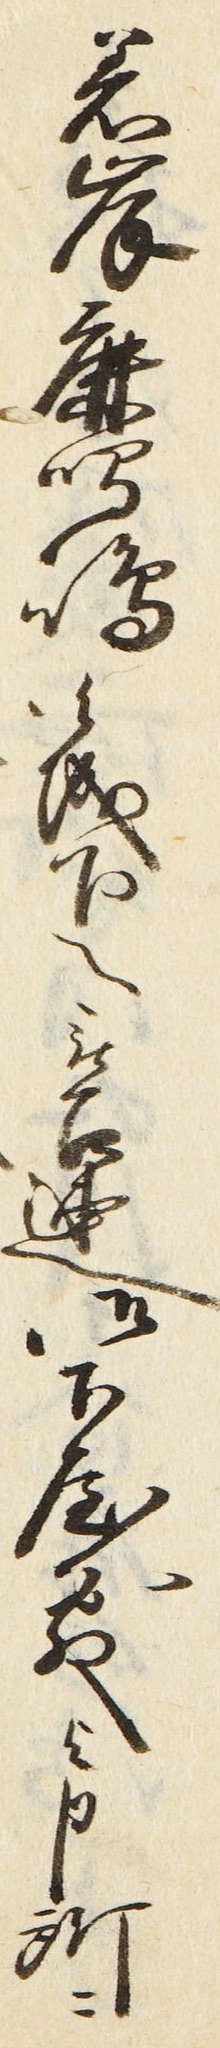着岸鹿児嶋之城下へ被召連御下屋敷と申所ニ
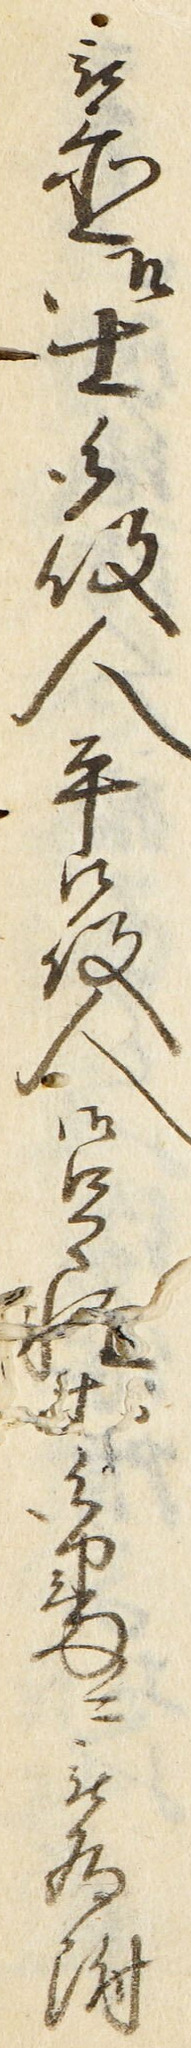被置御士御役人平御役人御足軽等御番ニ被為附
